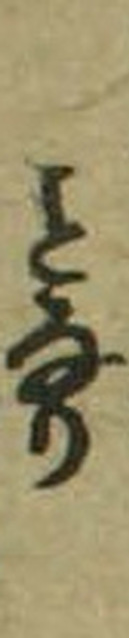ことなり

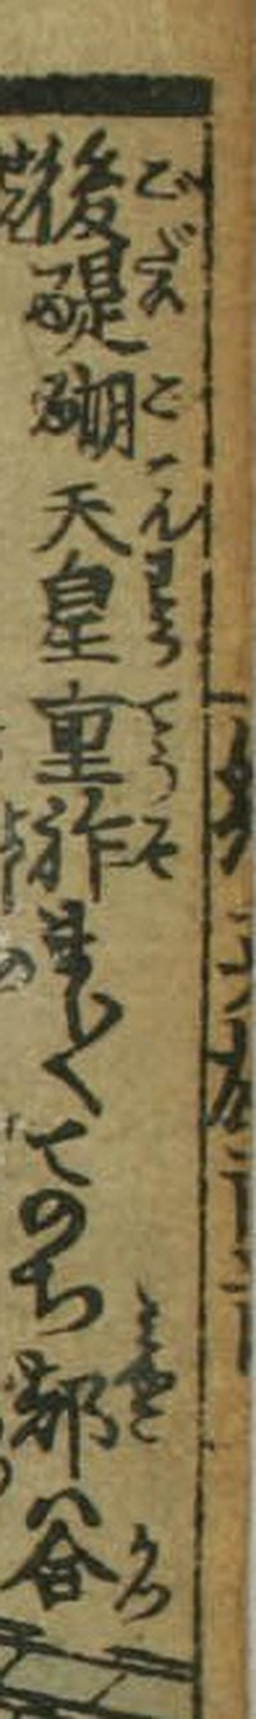後醍醐天皇重祚まし〳〵てのち都は合
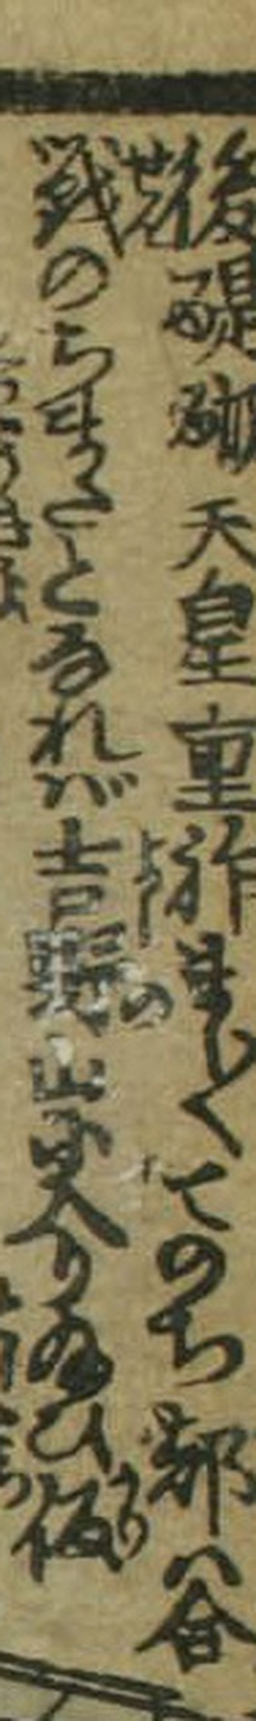戦のちまたとなれば吉野山に入り給ひ仮
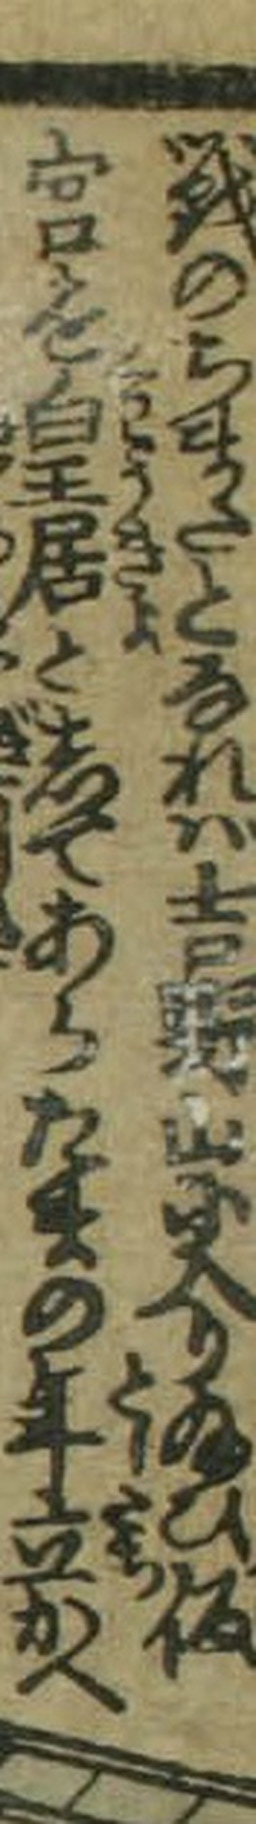宮を皇居としてあらたまの年立かへ
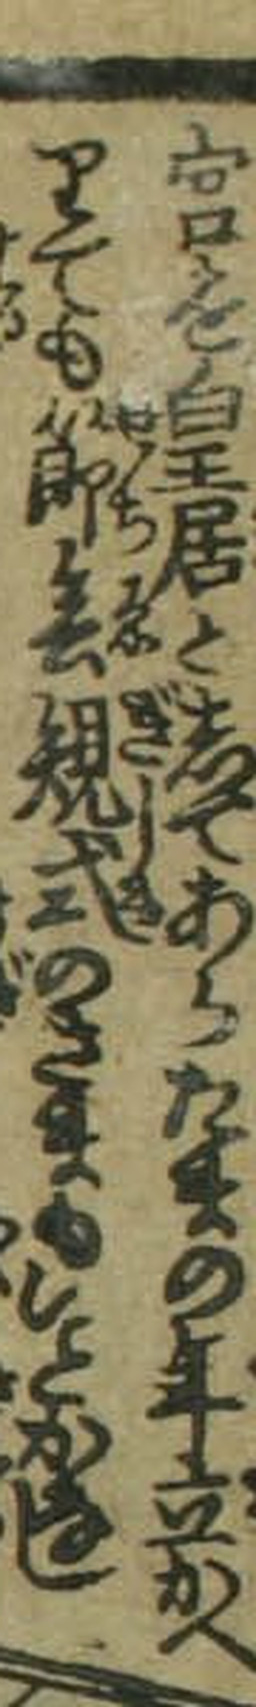りても節会規式のさまもいとかなし
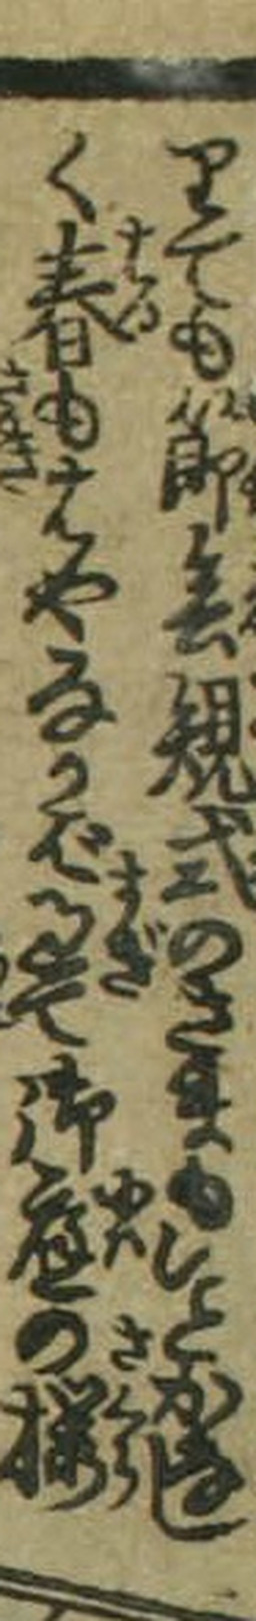く春もはやなかば過て御庭の桜
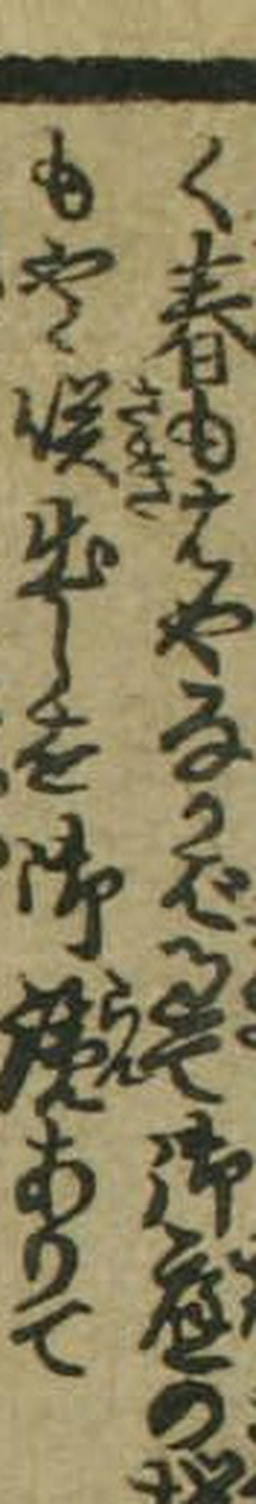もやゝ咲出しを御覧ありて
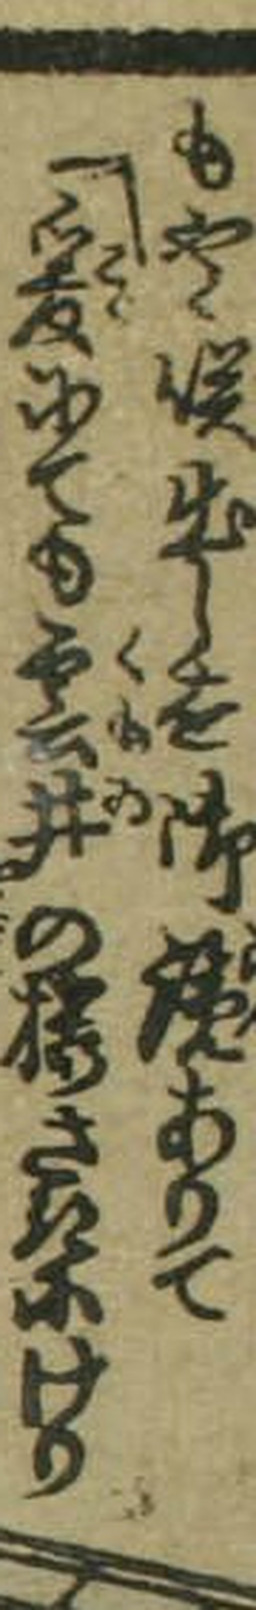〽爰にても雲井の桜さきにけり
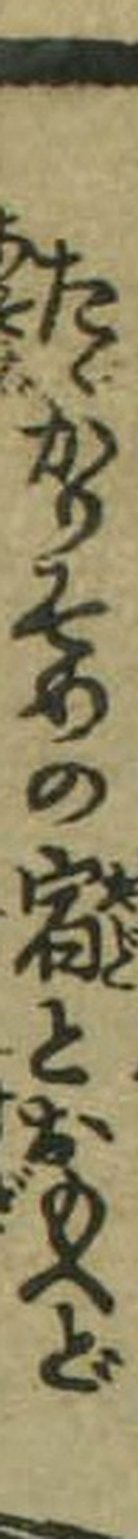たゝかりそめの宿とおもへど
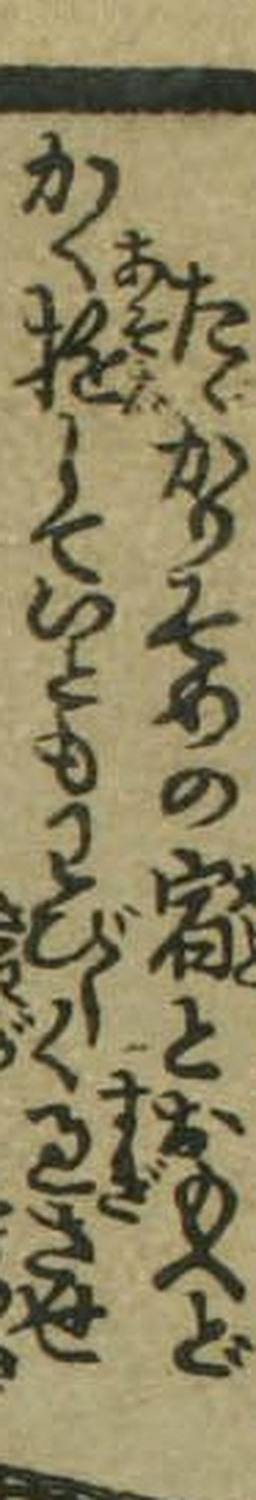かく遊していともわびしく過させ
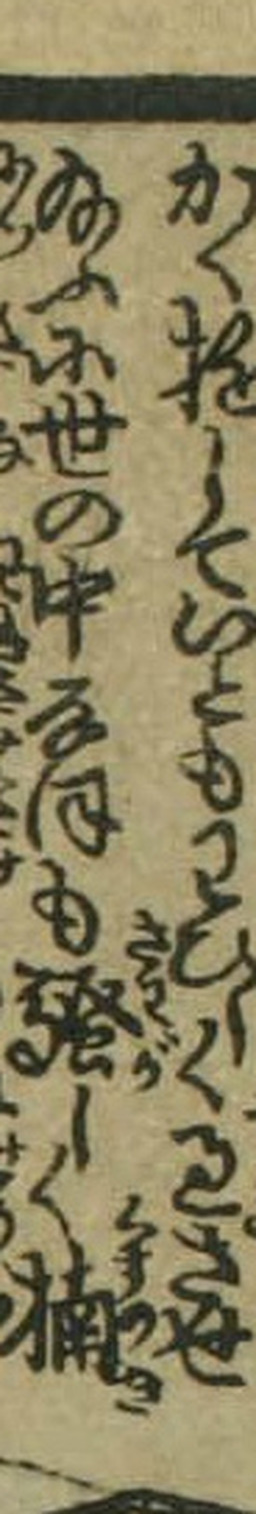給ふに世の中なほも騒しく楠
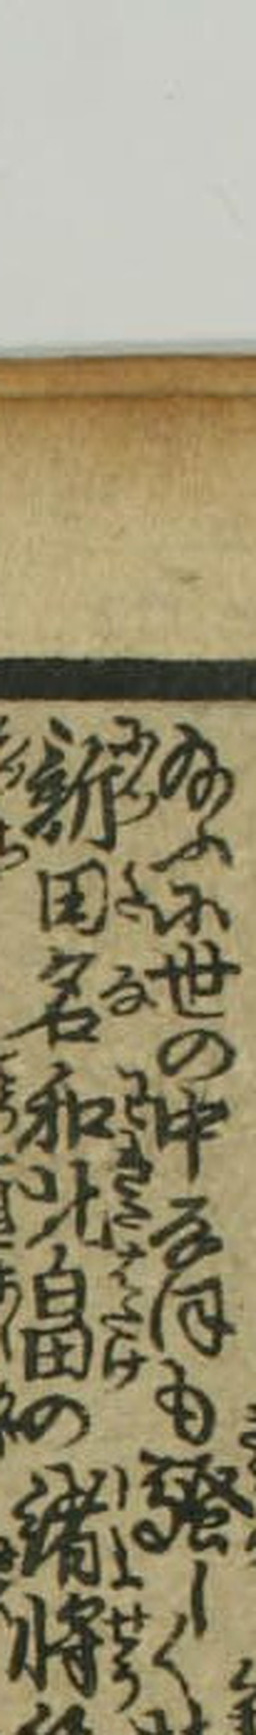新田名和北畠の諸将等
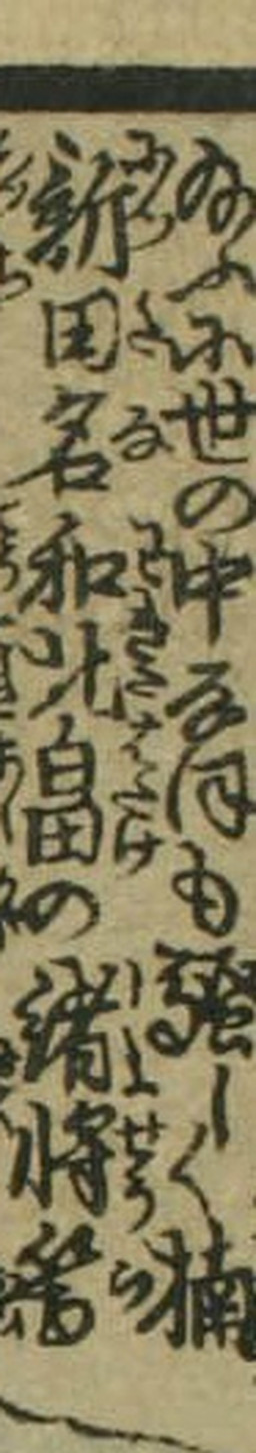新田名和北畠の諸将等
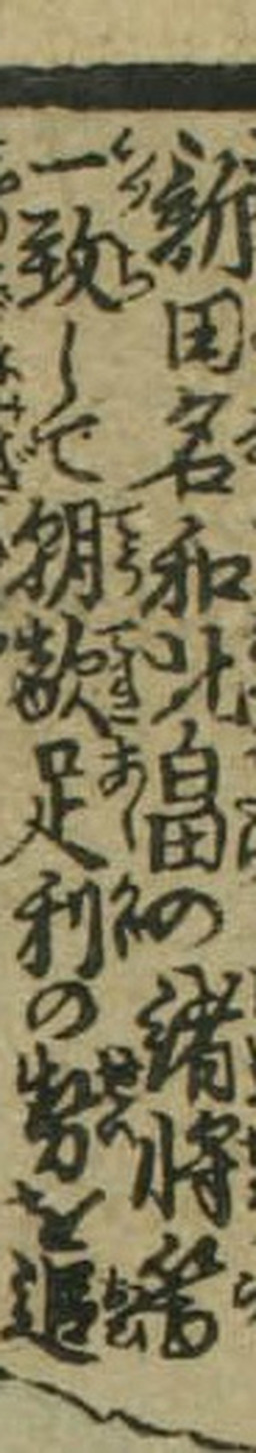一致して朝敵足利の勢を追
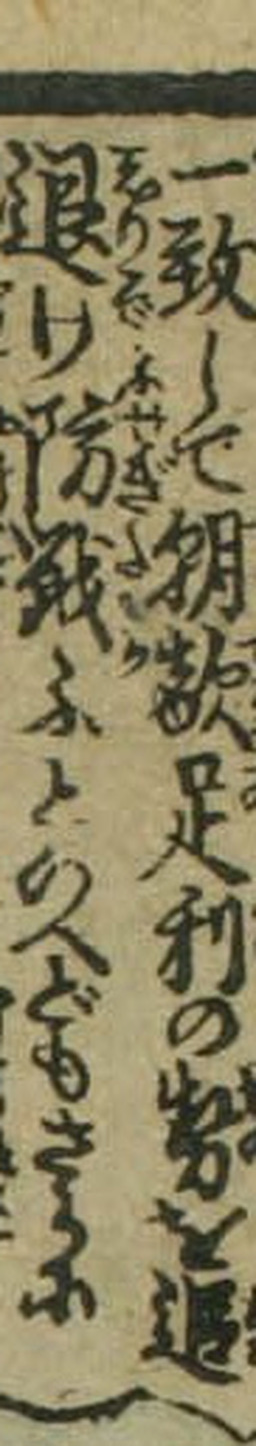退け防戦ふといへどもさらに
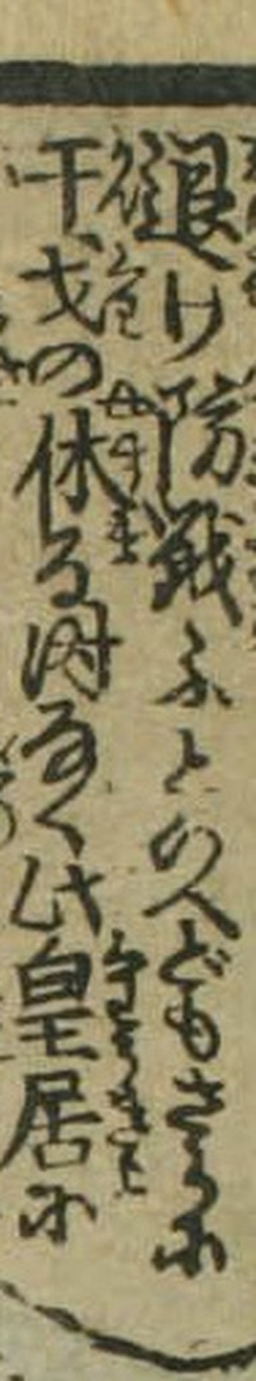干戈の休る時なく此皇居に
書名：續英雄百人一首
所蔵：東京学芸大学附属図書館
